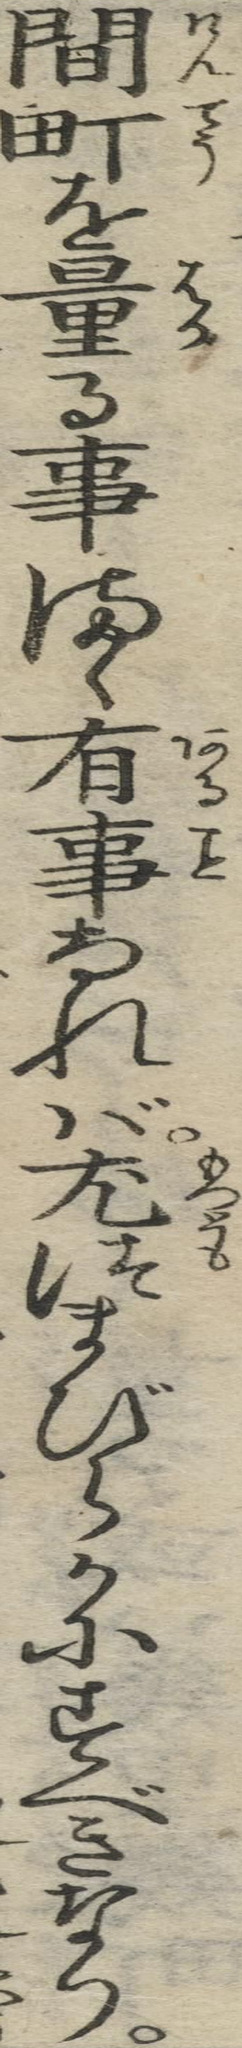間町を量る事まゝ有事なれば。尤つまびらかにすべきなり。
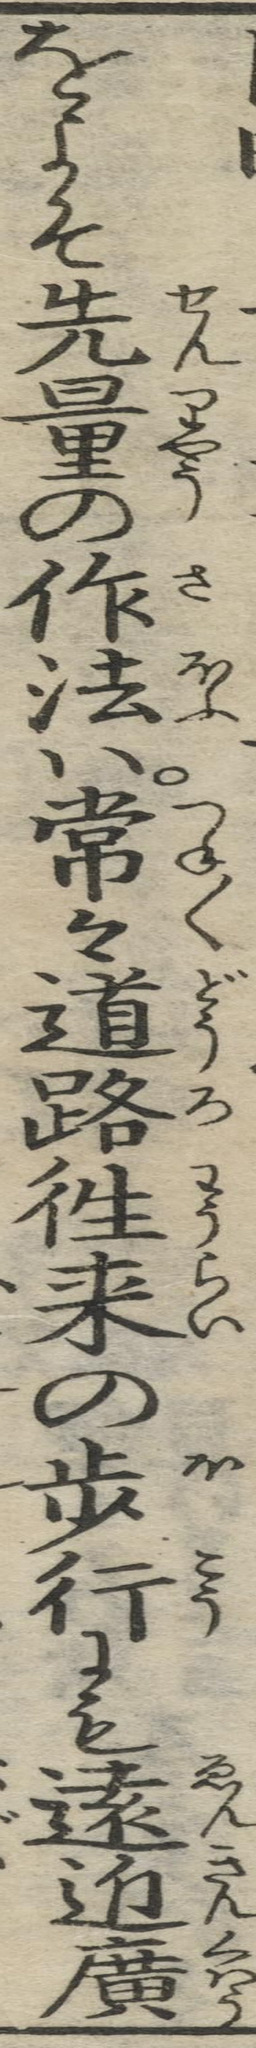をよそ先量の作法は。常々道路往来の歩行にも遠近広
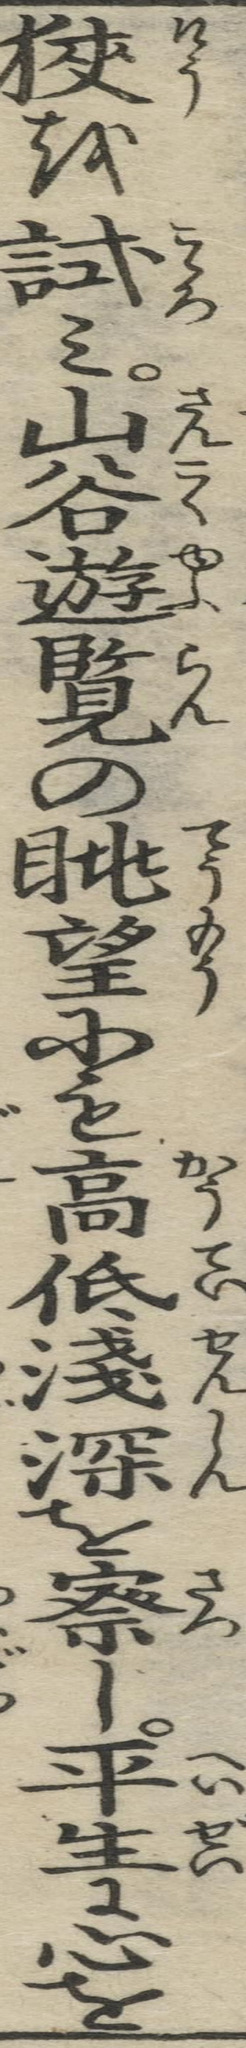狭を試み。山谷遊覧の眺望にも高低浅深を察し。平生に心を
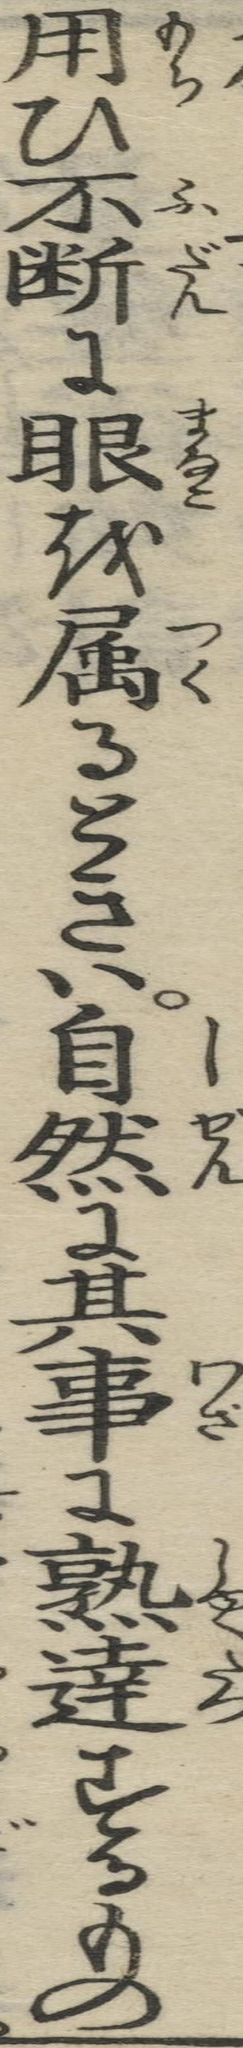用ひ不断に眼を属るときは。自然に其事に熟達するもの
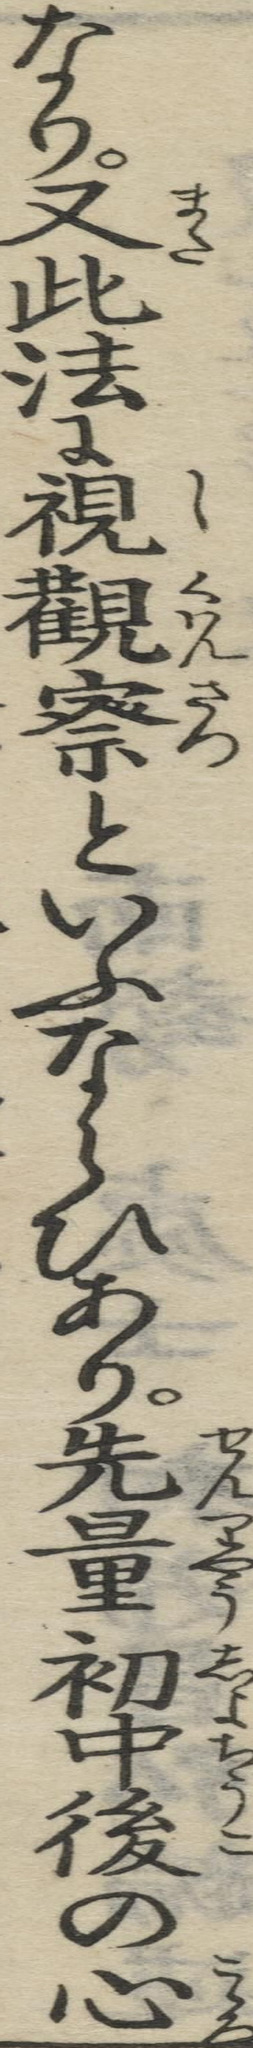なり。又此法に視観察といふならひあり。先量初中後の心
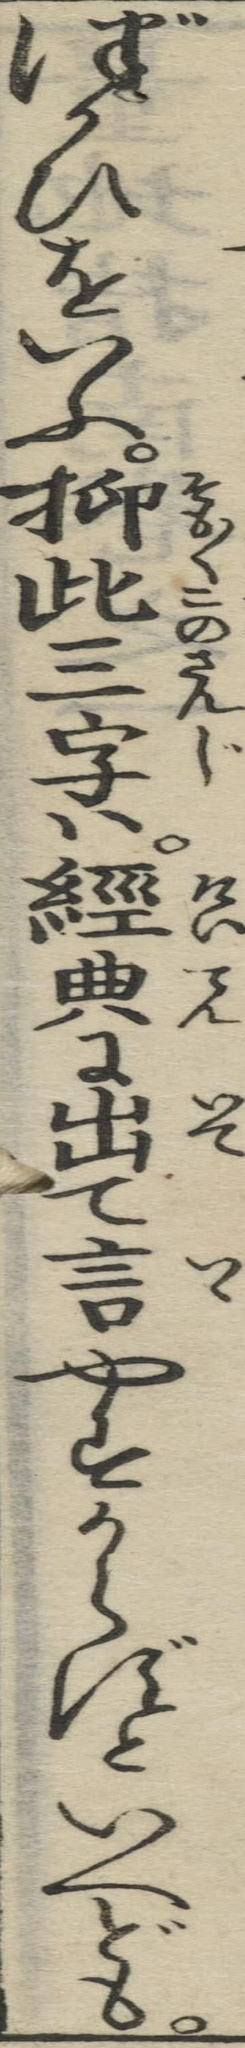づかひをいふ。抑此三字は。経典に出て言やわからずといへども。
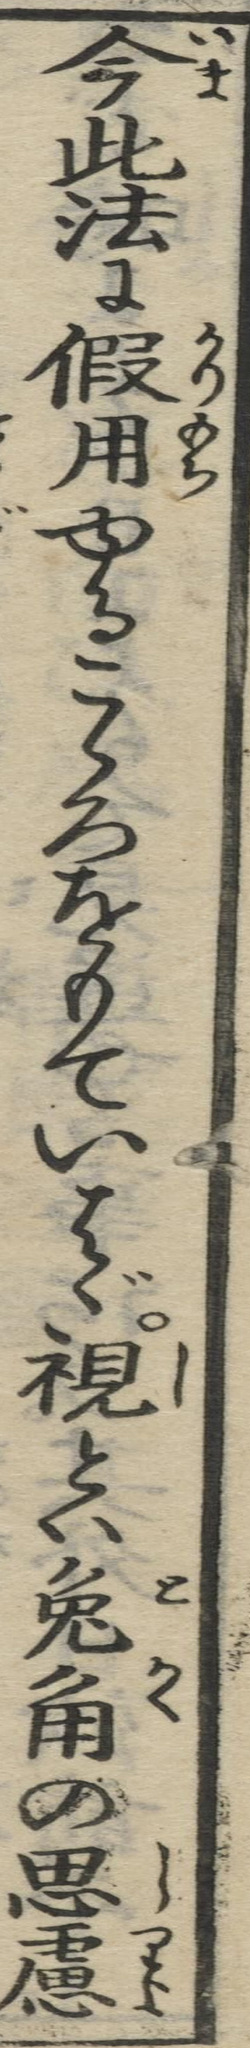今此法に仮用ゆるこゝろをもていはゞ。視とは兎角の思慮
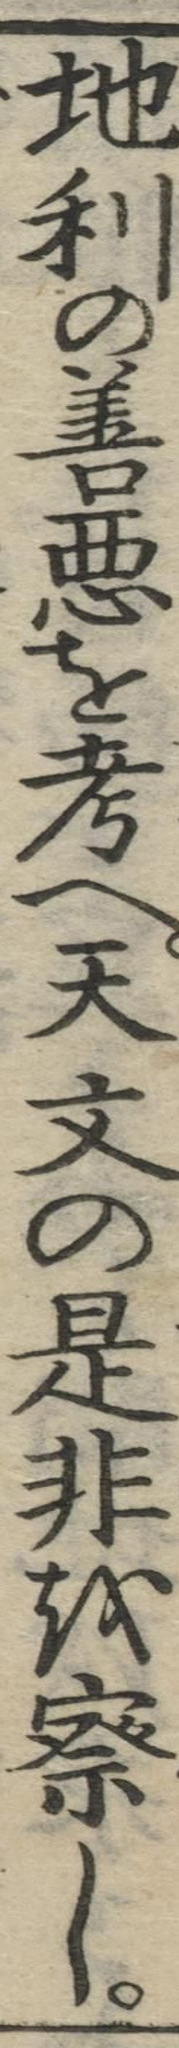地利の善悪を考へ。天文の是非を察し。
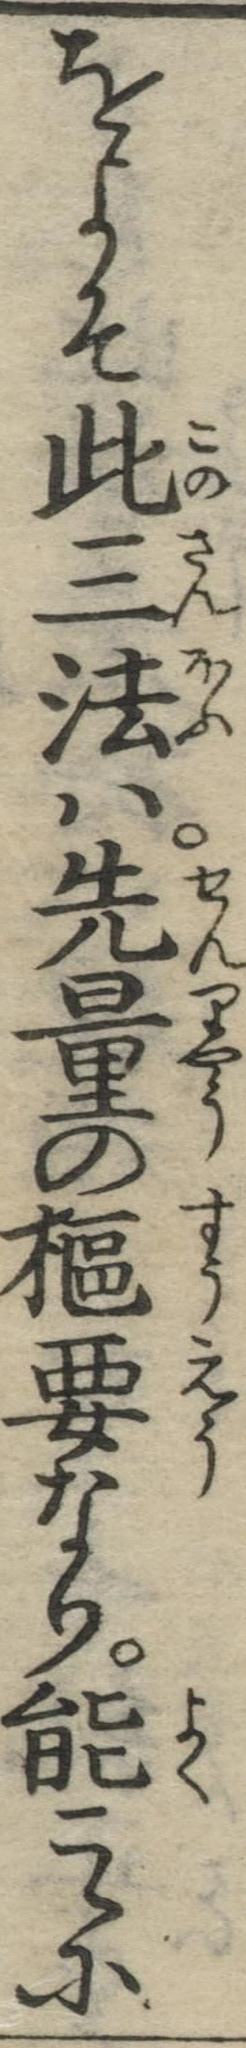をよそ此三法は。先量の枢要なり。能こゝに
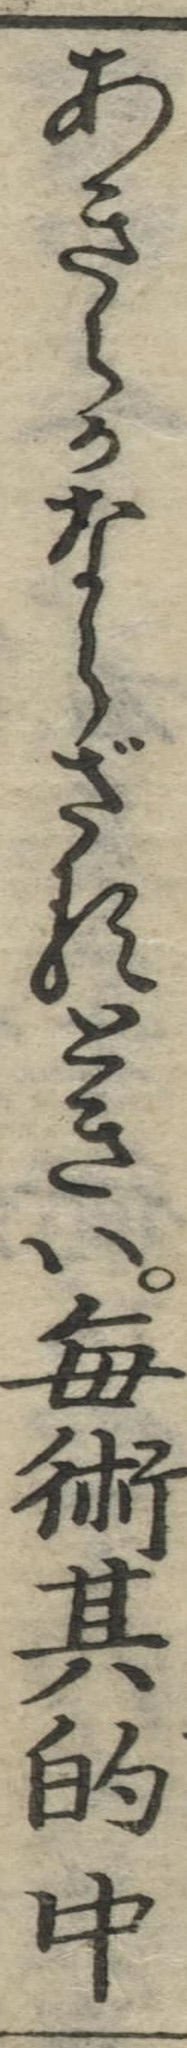あきらかならざるときは。毎術其的中

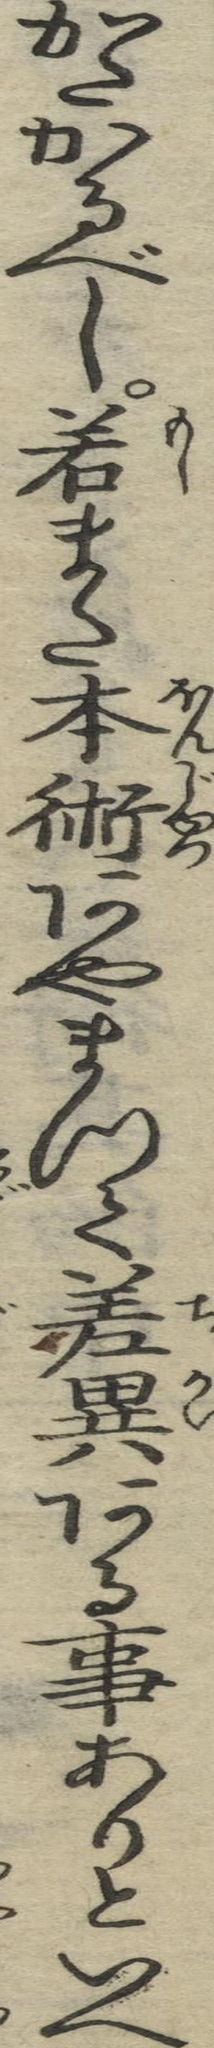かたかるべし。若また本術あやまつて差異ある事ありといへ
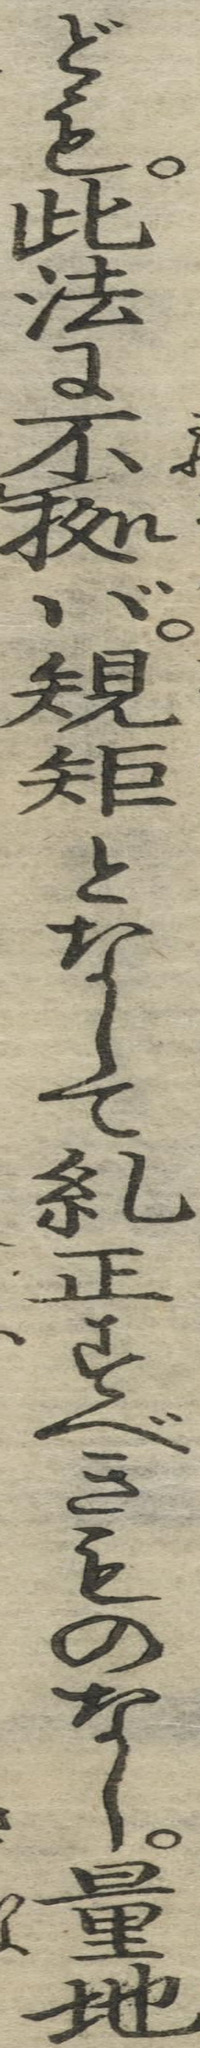ども。此法に不拠ば。規矩となして糺正すべきものなし。量地
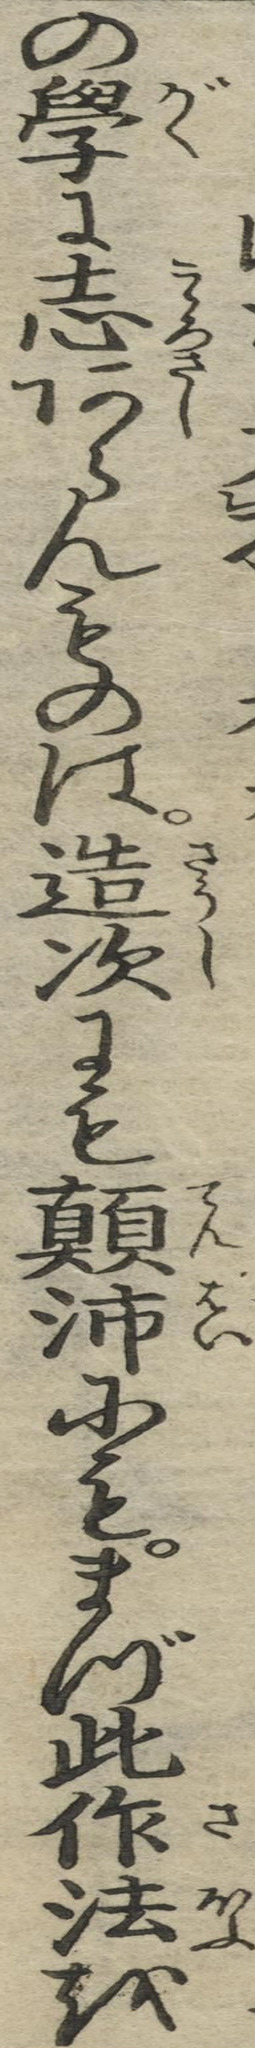の学に志あらんものは。造次にも顚沛にも。まづ此作法を
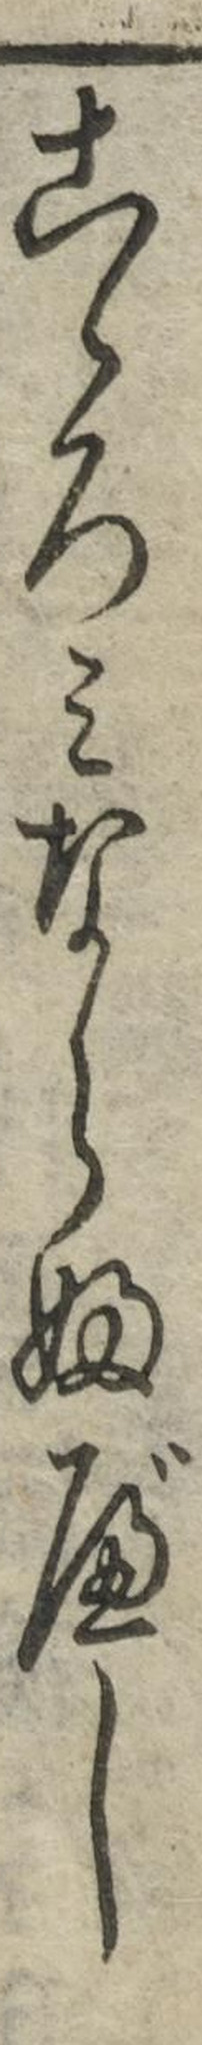こゝろみならふべし
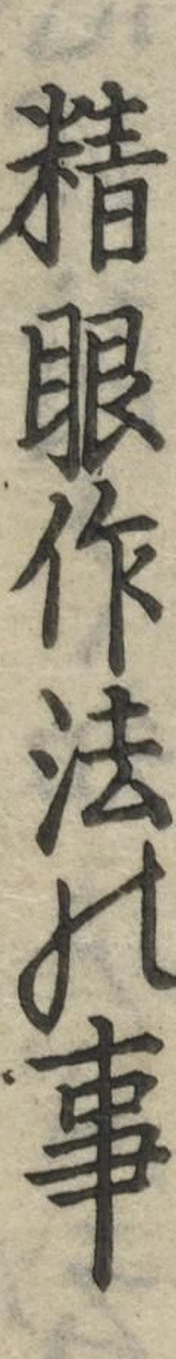精眼作法の事
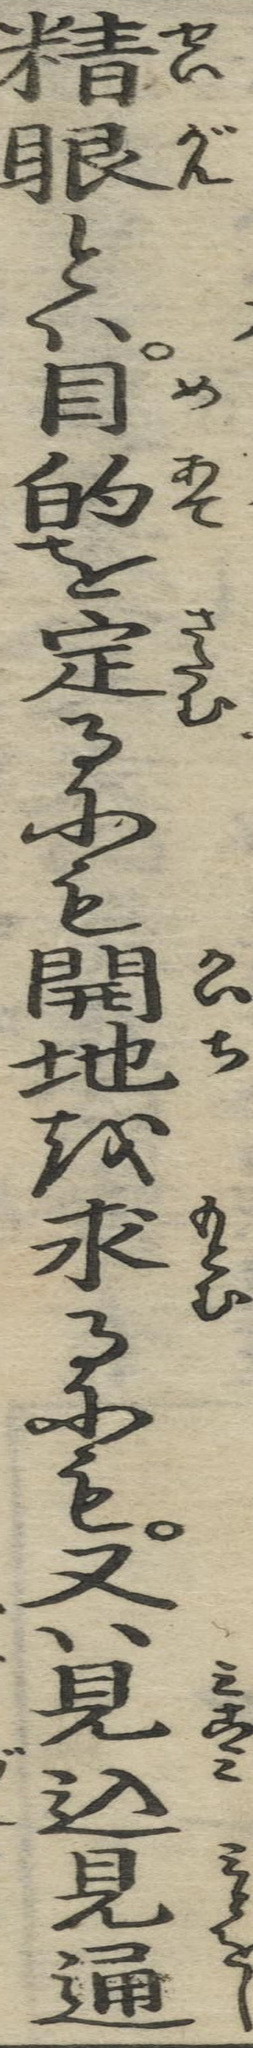精眼とは。目的を定るにも開地を求るにも。又は見込見通
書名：量地指南　巻之一（内題）
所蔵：東京大学地震研究所図書室 Earthquake Research Institute Library, The University of Tokyo, JAPAN
